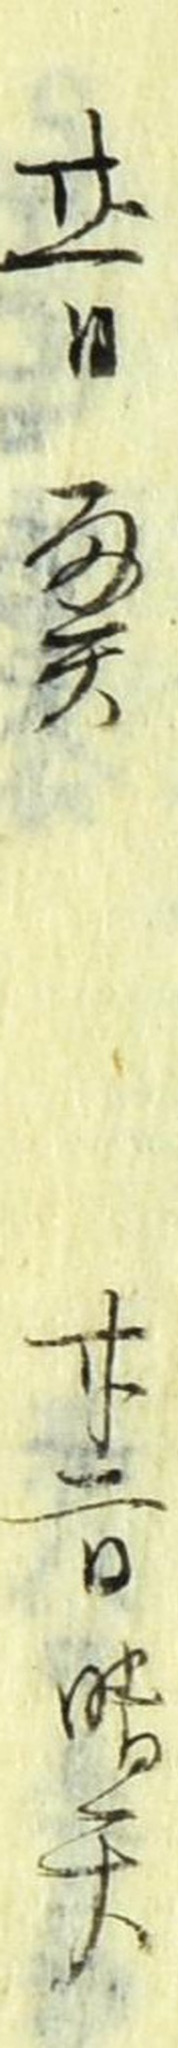廿一日雨天廿二日晴天

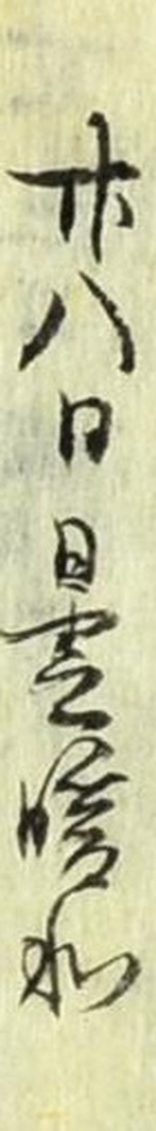廿九日曇暖和
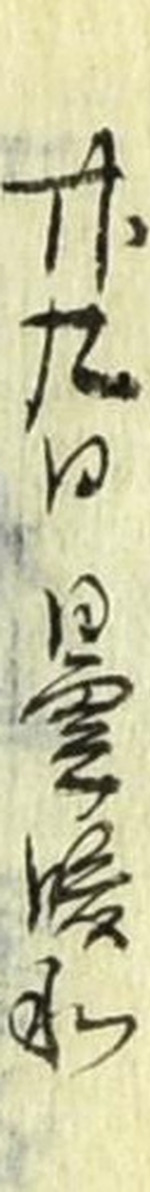廿九日曇暖和
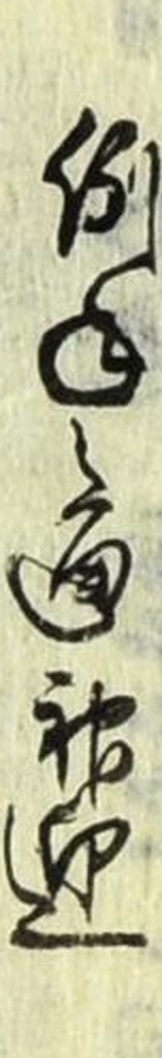例年之通神迎
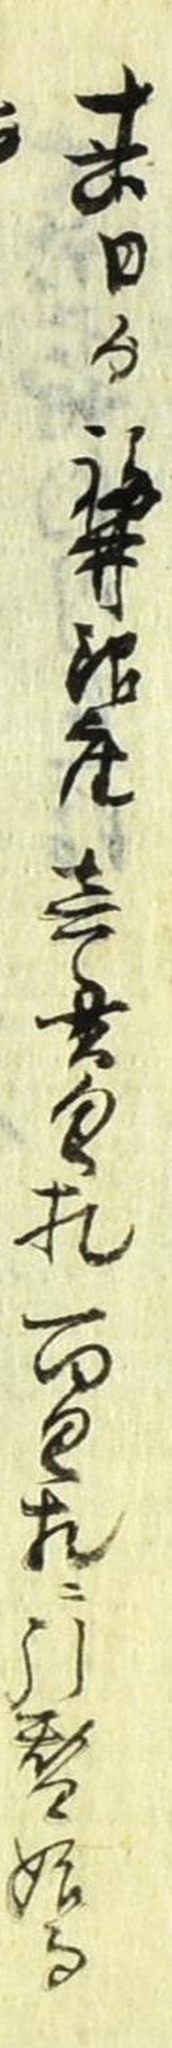十六日ゟ福井銀座壱貫匁札百匁札に引替始る
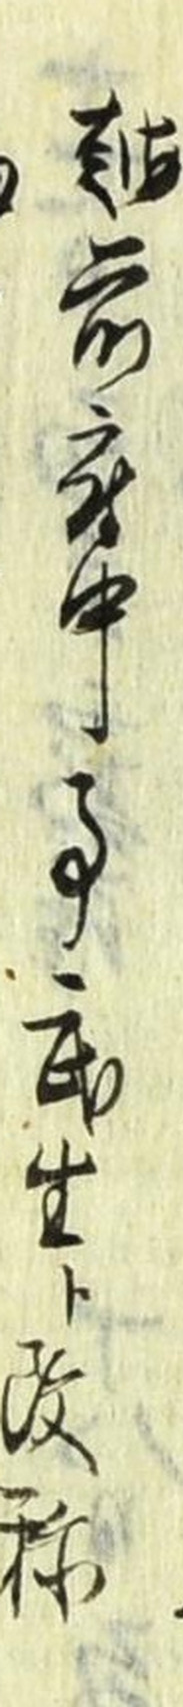越前府中事武生と改称
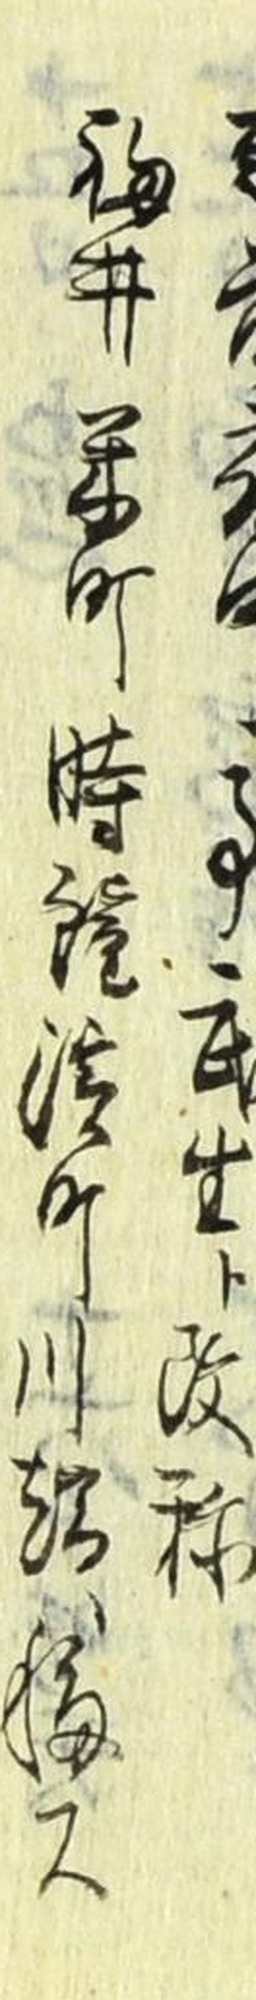福井米町時鐘浜町川端へ移す

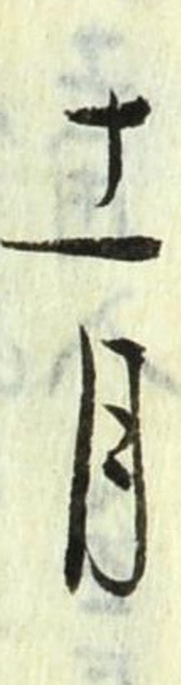十一月
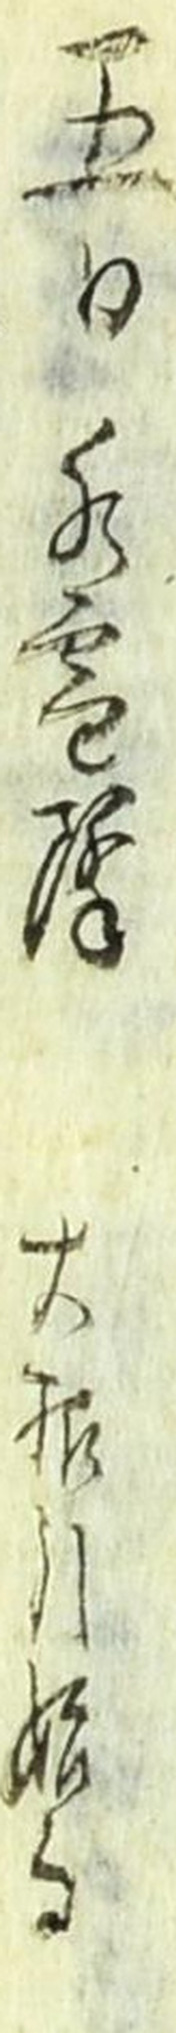五日水雪降大根引始る
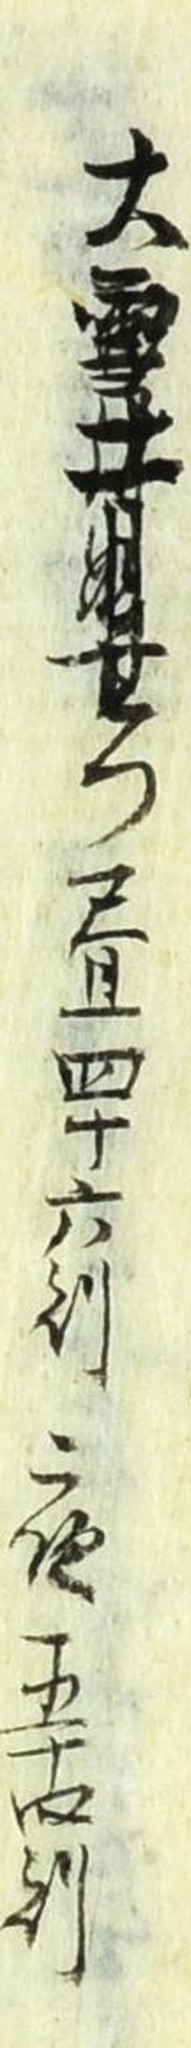大雪十一月せつ昼四十六刻夜五十四刻
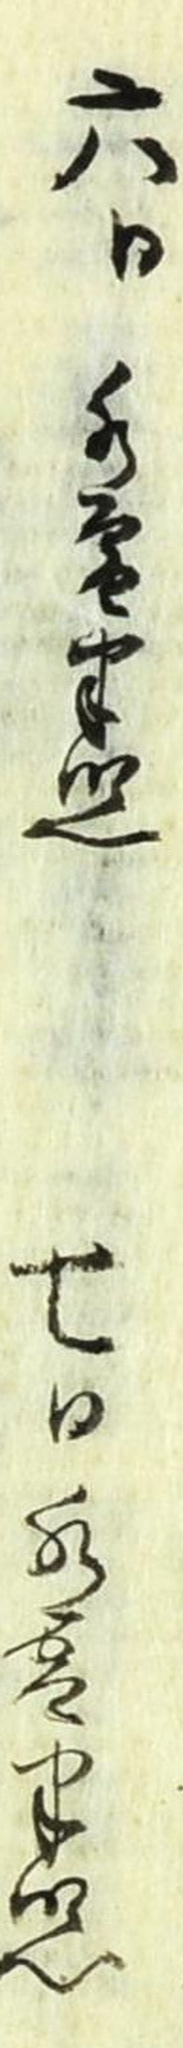六日水雪半照七日水雪半照
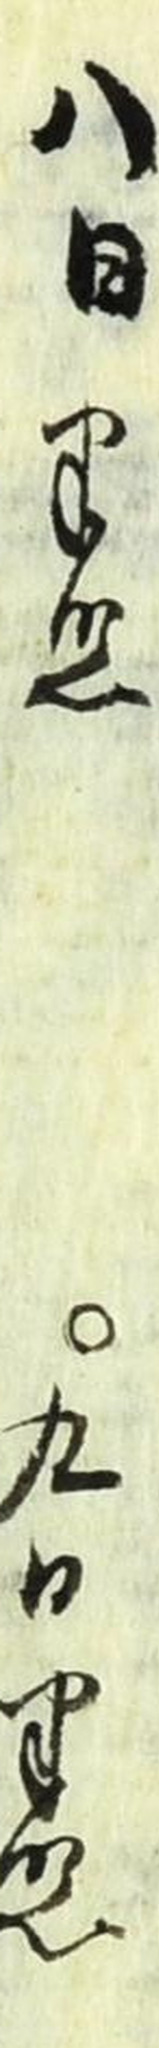八日半照○九日半照
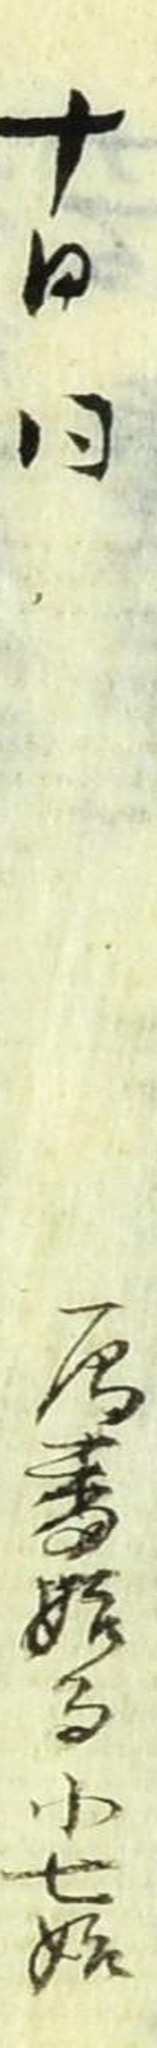十日同雁番始る小七始
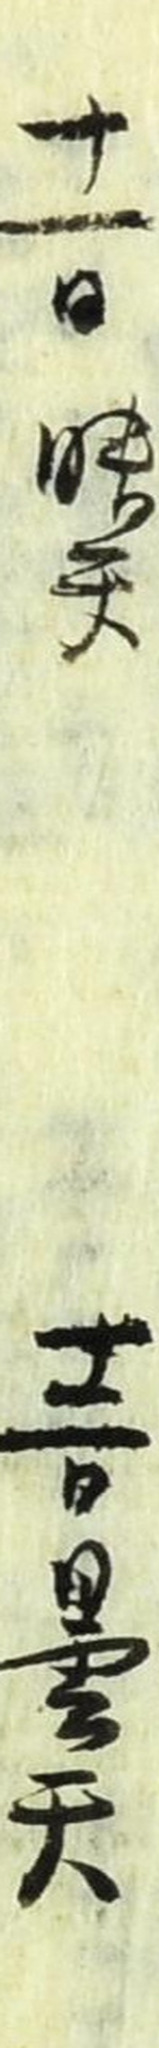十一日晴天十二日曇天
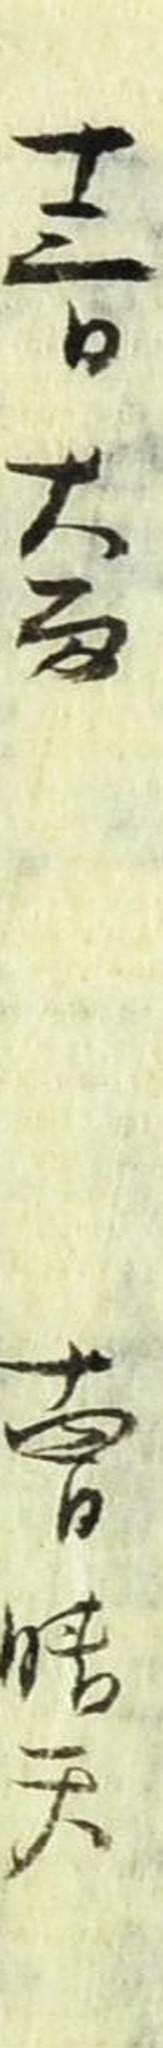十三日大雨十四日晴天
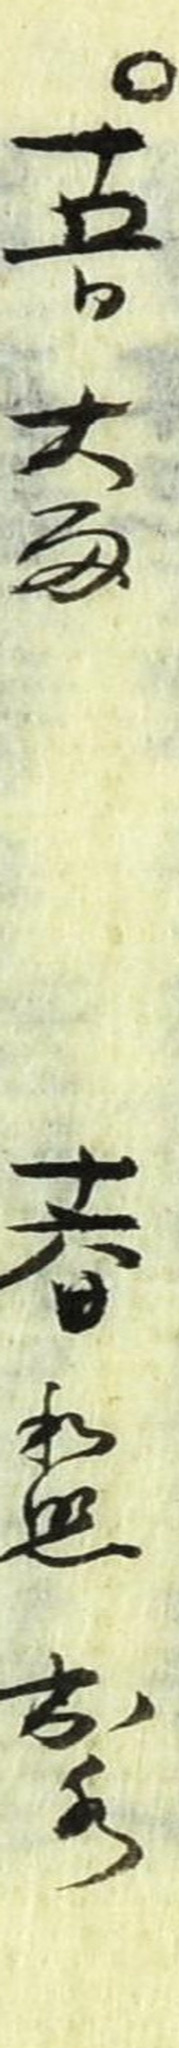○十五人大雨十六日和照出水
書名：（日記）
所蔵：福井県文書館 Fukui Prefectural Archives
